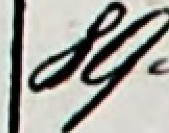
89
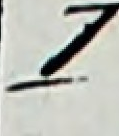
I
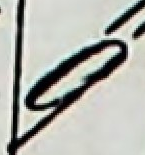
9
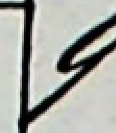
9
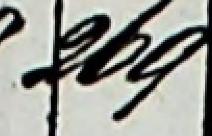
269
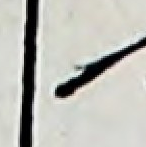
1
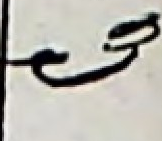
3
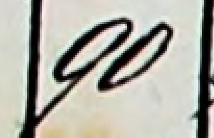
90
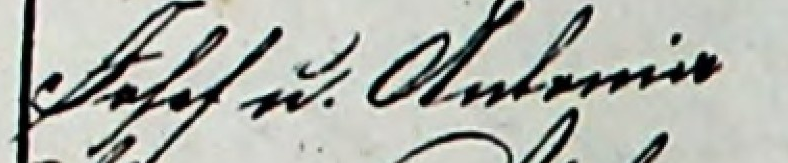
Josef u. Antonia
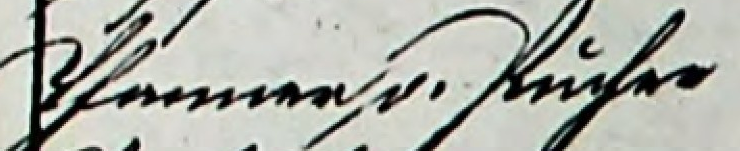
Thanner v. Pucher
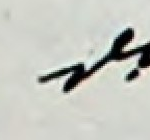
do
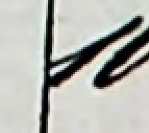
10
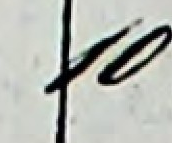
10
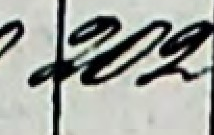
202
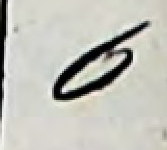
6
